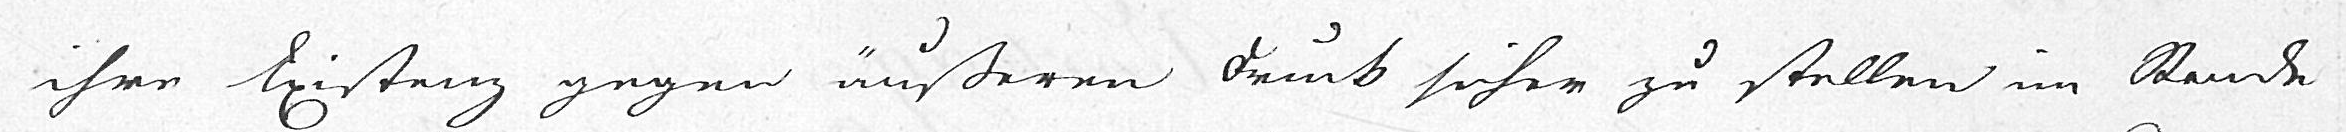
ihre Existenz gegen äußeren Druck sicher zu stellen im Stande
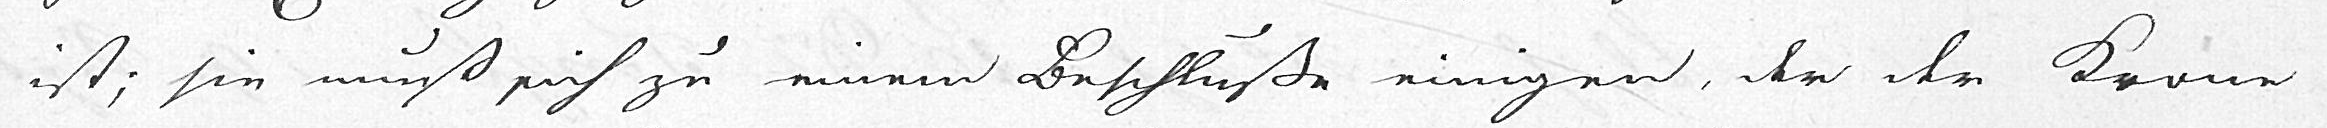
ist; sie muß sich zu einen Beschluße einigen, der der Krone
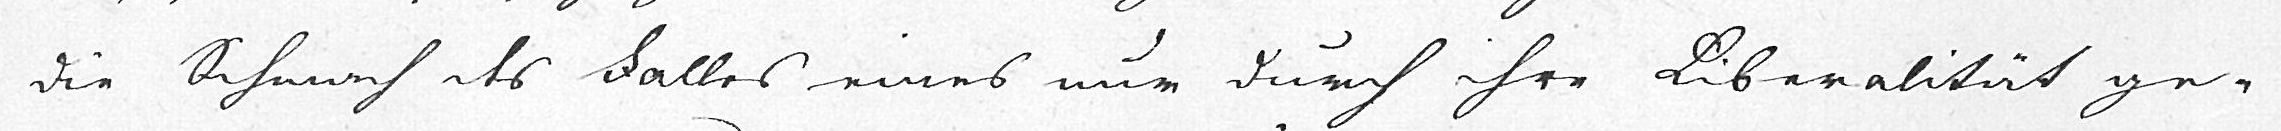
die Schmach des Falles eines nur durch ihre Liberalität ge-
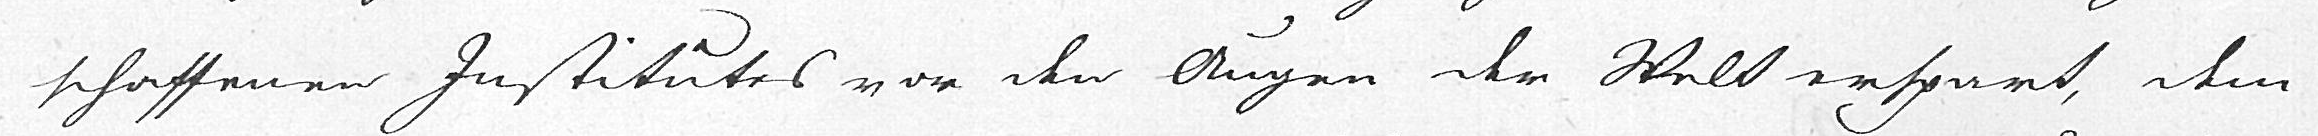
schaffenen Institutes vor den Augen der Welt erspart, dem
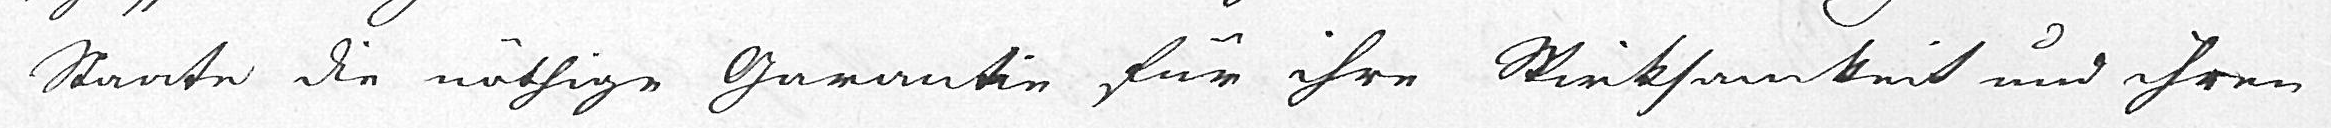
Staate die nöthige Garantie für ihre Wirksamkeit und ihren
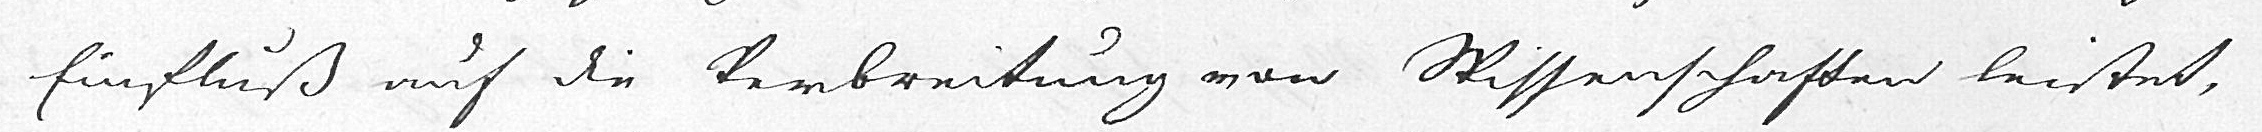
Einfluß auf die Verbreitung von Wissenschaften leistet,
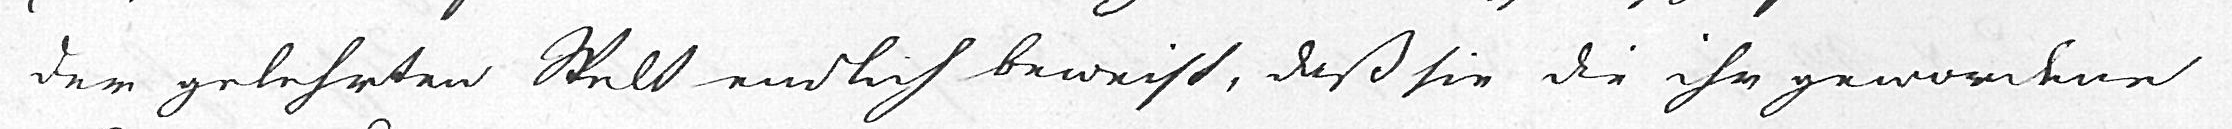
der gelehrten Welt endlich beweist, daß sie die ihr gewordene
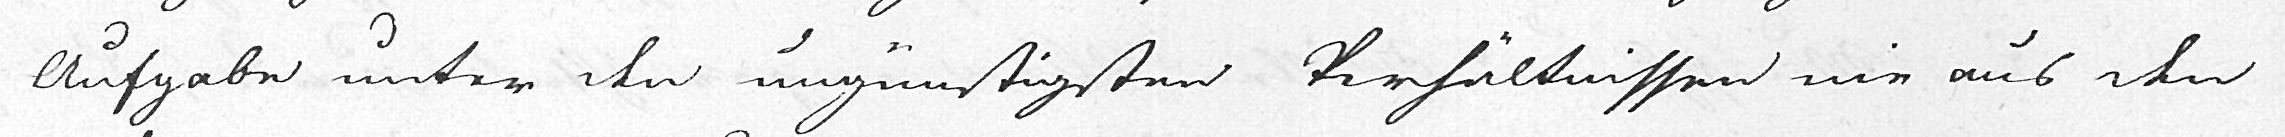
Aufgabe unter den ungünstigsten Verhältnissen nie aus den
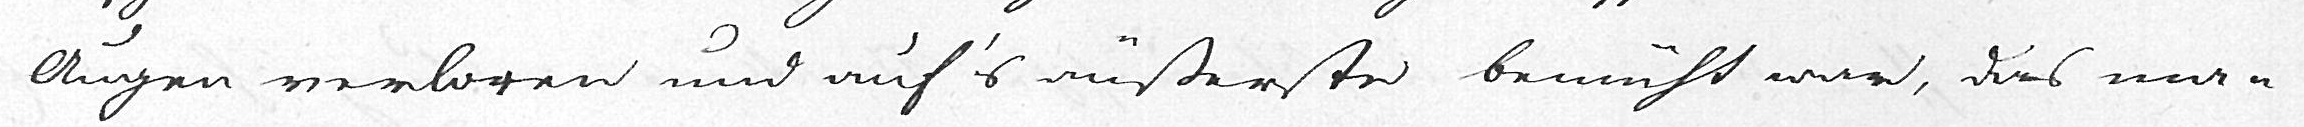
Augen verloren und auf's äußerste bemüht war, das ma-
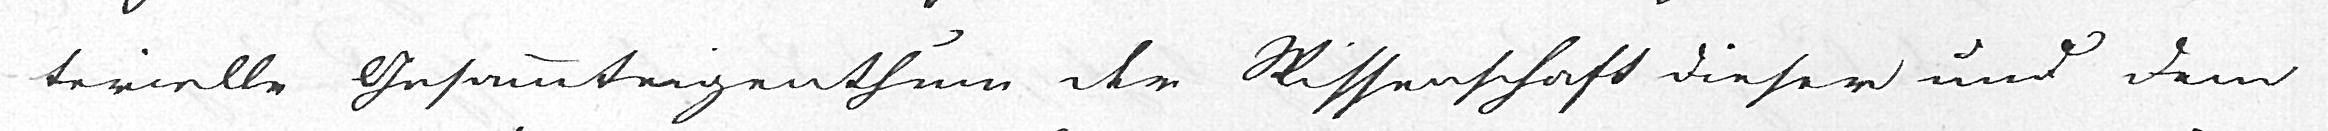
terielle Gesammteigenthum der Wissenschaft dieser und dem
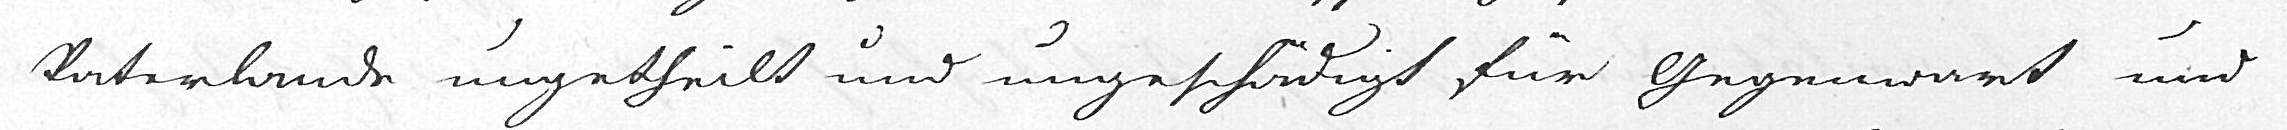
Vaterlande ungetheilt und ungeschädigt für Gegenwart und
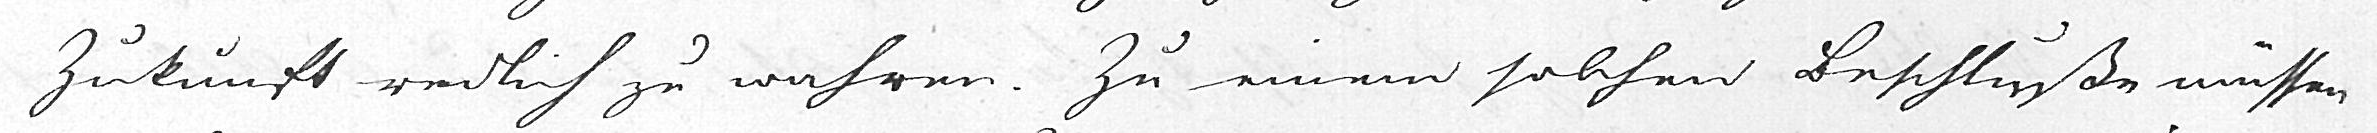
Zukunft redlich zu wahren. Zu einem solchen Beschluße müssen
